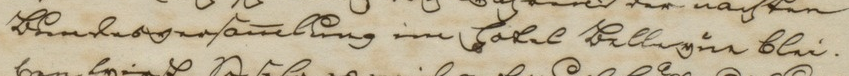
Bundesversammlung im Hotel Bellevüe blei-
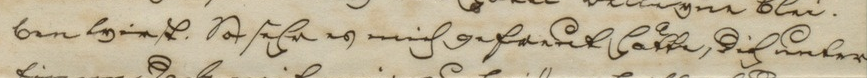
ben wirst. So sehr es mich gefreut hätte, Dich unter
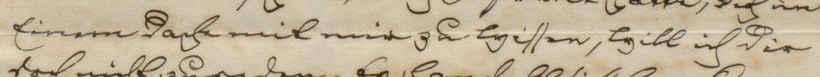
Einem Dache mit mir zu wissen, will ich dir
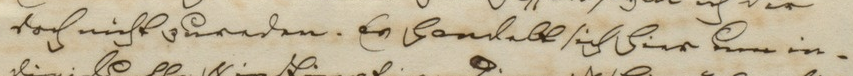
doch nicht zureden. Es handelt sich hier um in-
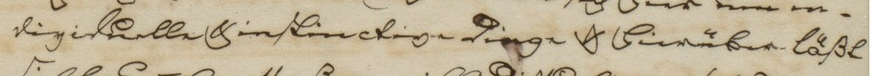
dividuelle u. instinctive Dinge & hierüber läßt
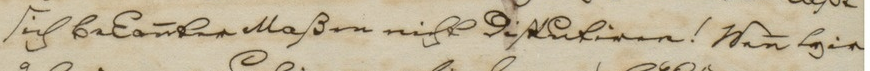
sich bekannter Maßen nicht diskutiren! Wenn wir
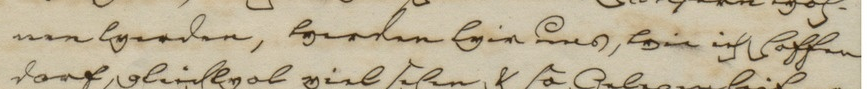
nen werden, werden wir uns, wie ich hoffen
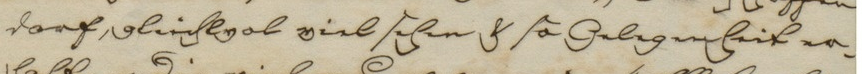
darf, gleichwohl viel sehen & so Gelegenheit er-
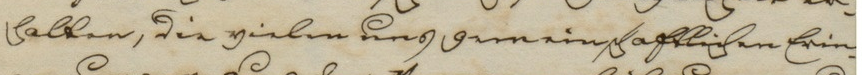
halten, die vielen uns gemeinschaftlichen Erin-
